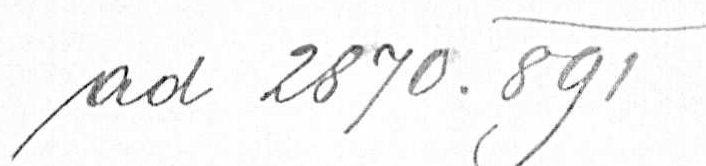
Ad 2870 1891
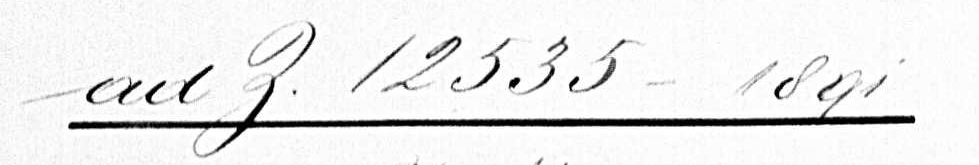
Ad Z. 12535 – 1891/
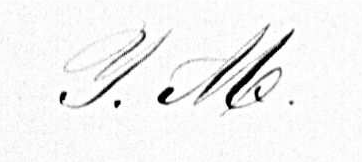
JM
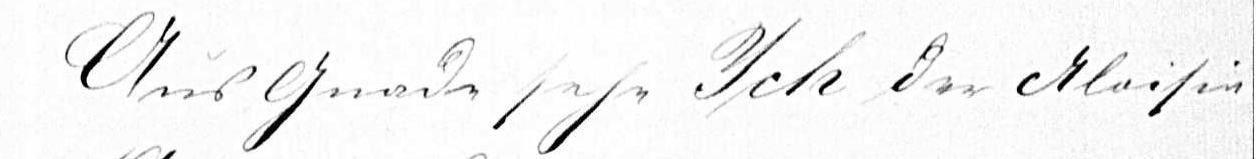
Aus Gnade sehe Ich der Aloisia
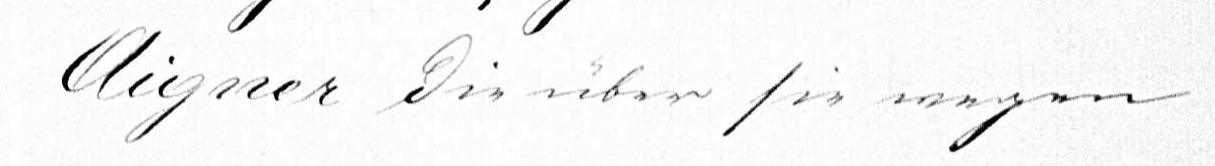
Aigner die über sie wegen
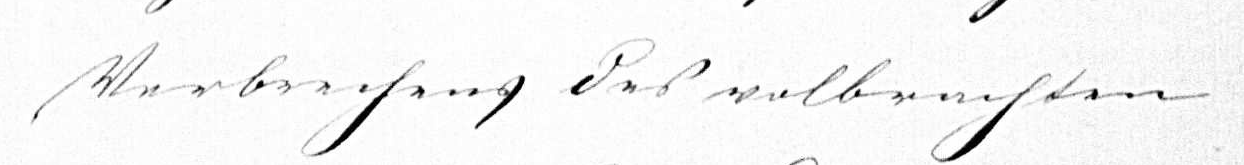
Verbrechens des vollbrachten
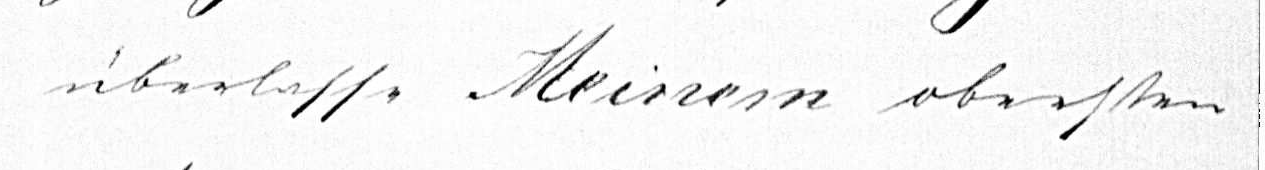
überlasse Meinem Obersten
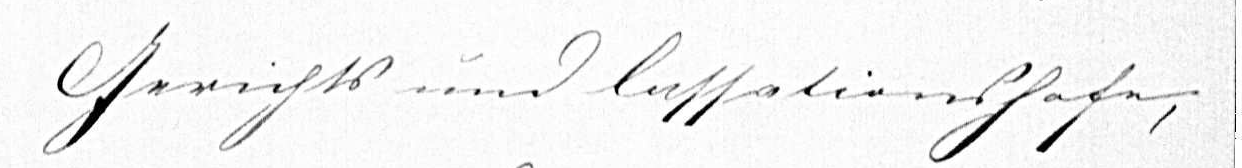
Gerichts- und Kassationshofe,
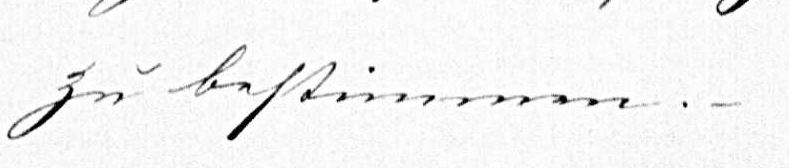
zu bestimmen.
